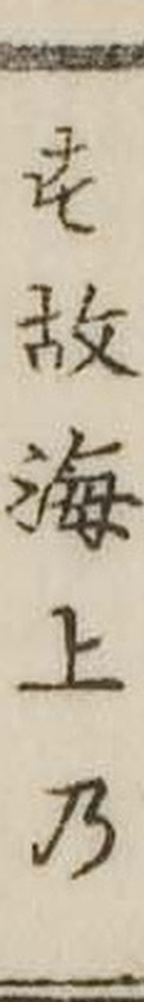す故海上の
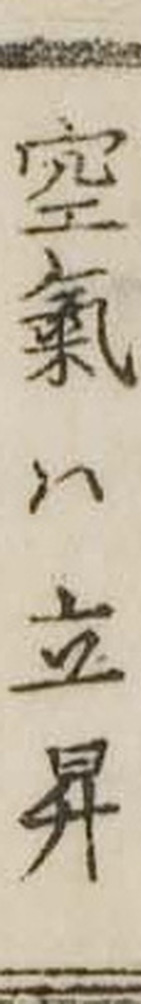空氣は立昇
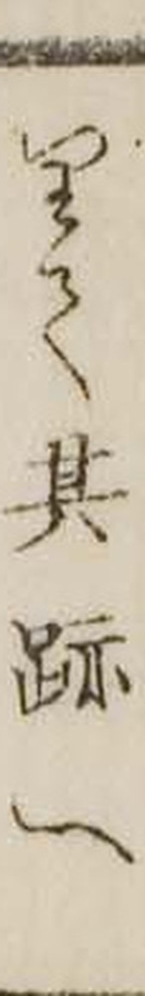りて其跡へ
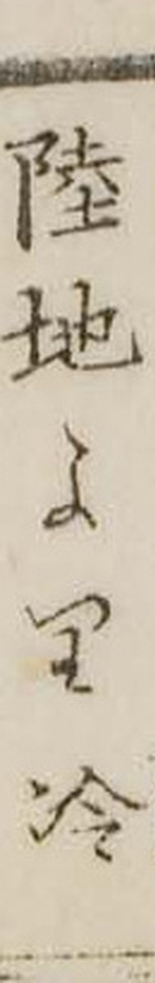陸地より冷
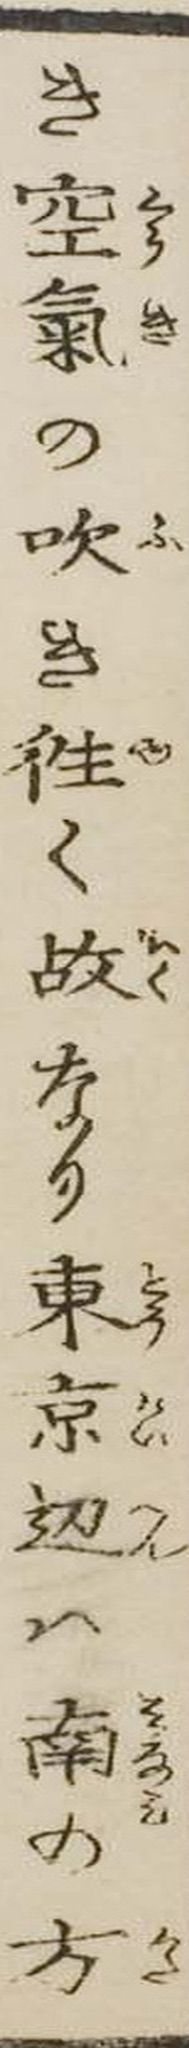き空氣の吹き往く故なり東京辺は南の方
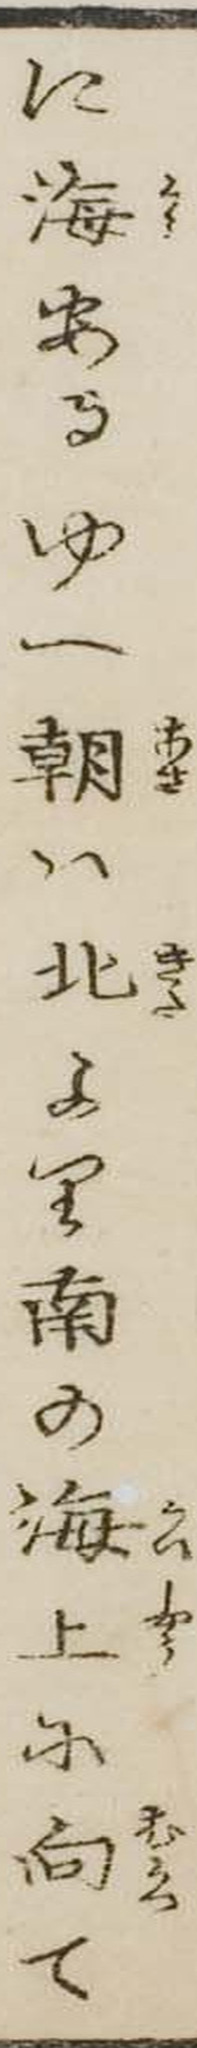に海あるゆへ朝は北より南の海上に向て
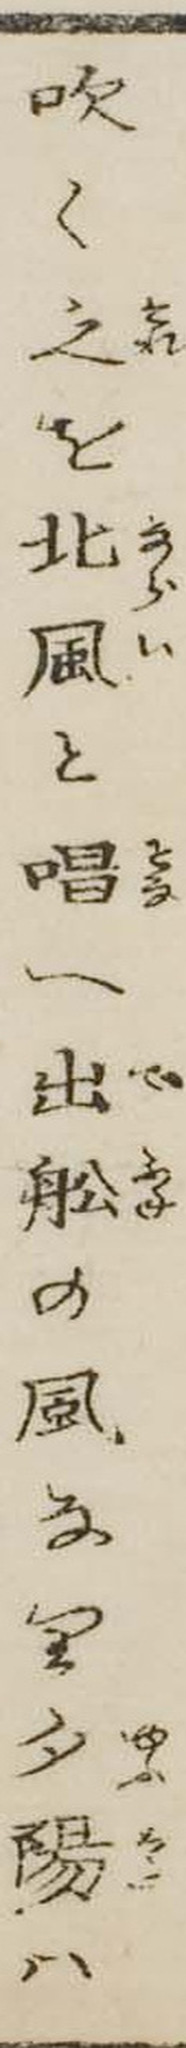吹く之を北風と唱へ出舩の風なり夕陽は
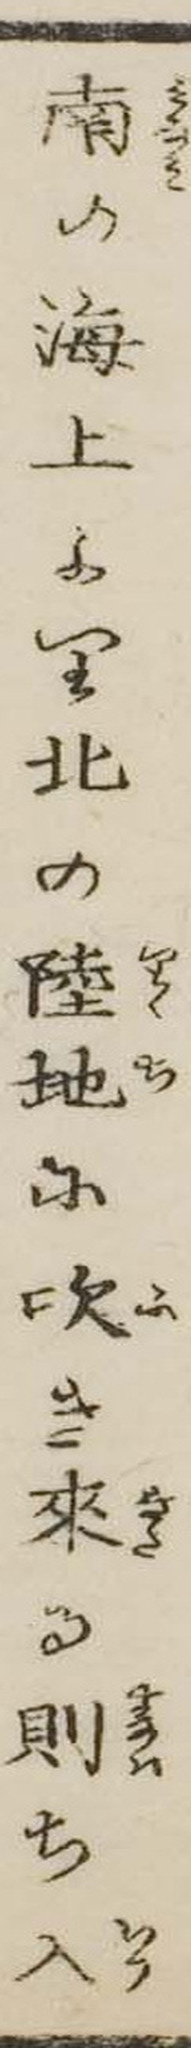南の海上より北の陸地に吹き來る則ち入
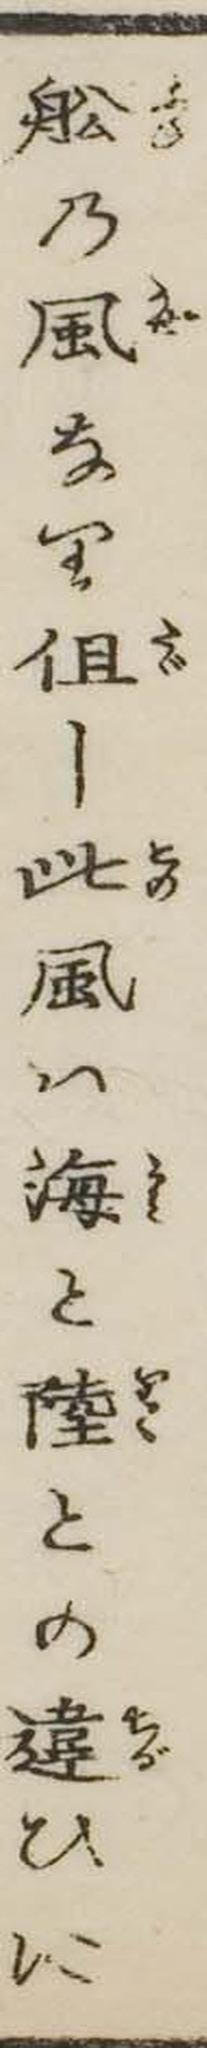舩の風なり但し此風は海と陸との違ひに
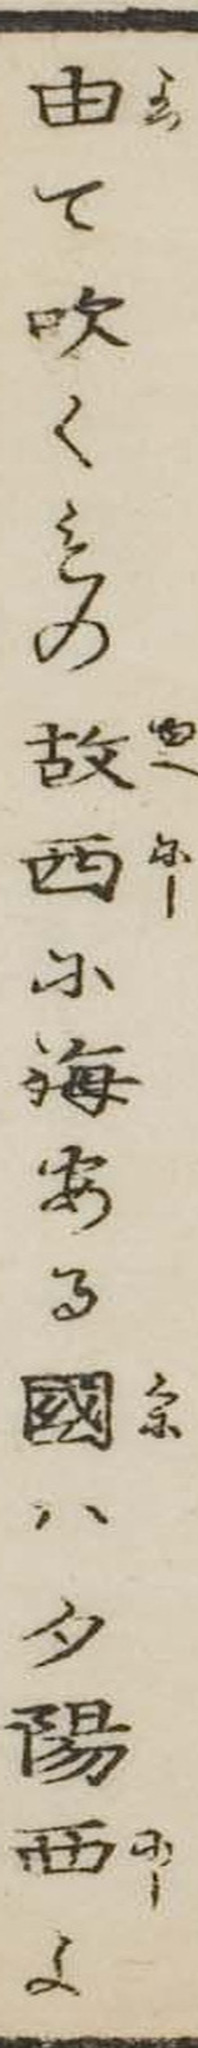由て吹くもの故西に海ある國は夕陽西よ
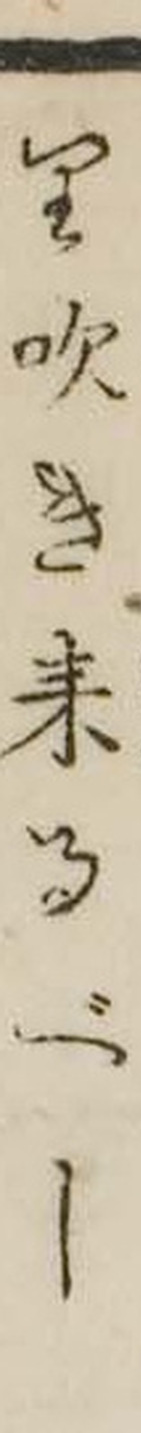り吹き来るべし
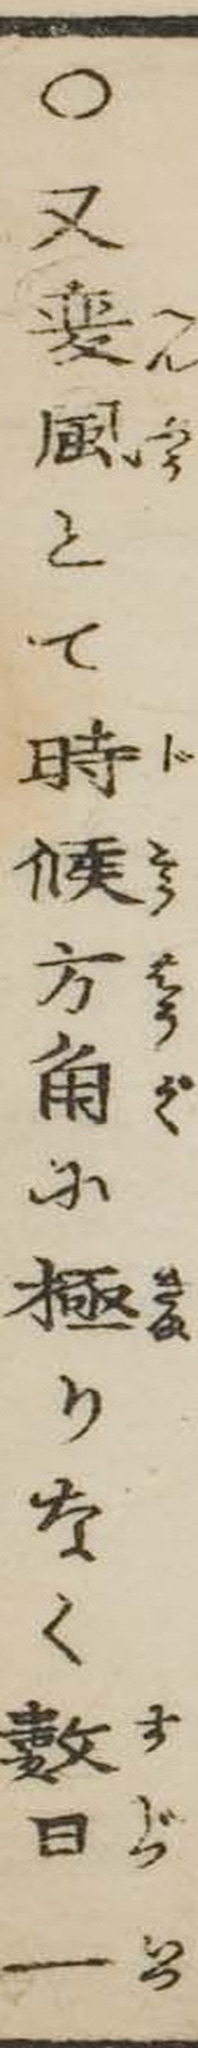◯又変風とて時候方角に極りなく數日一

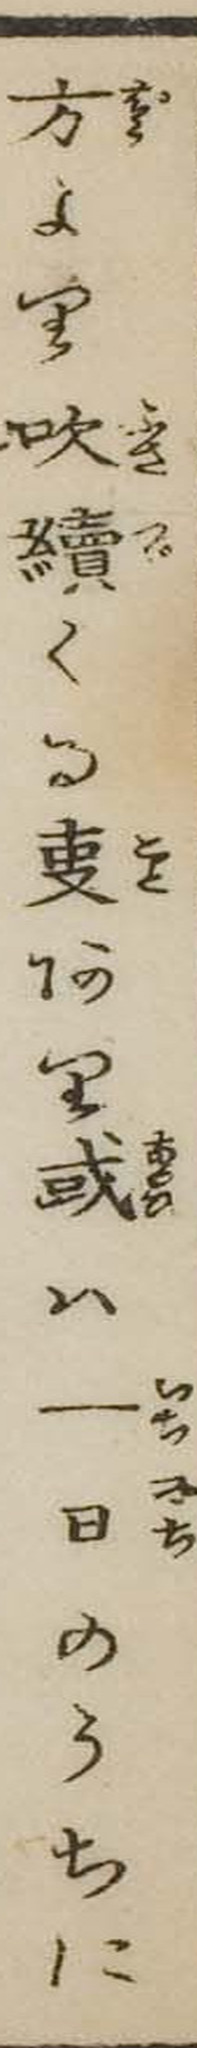方より吹續くる叓あり或は一日のうちに
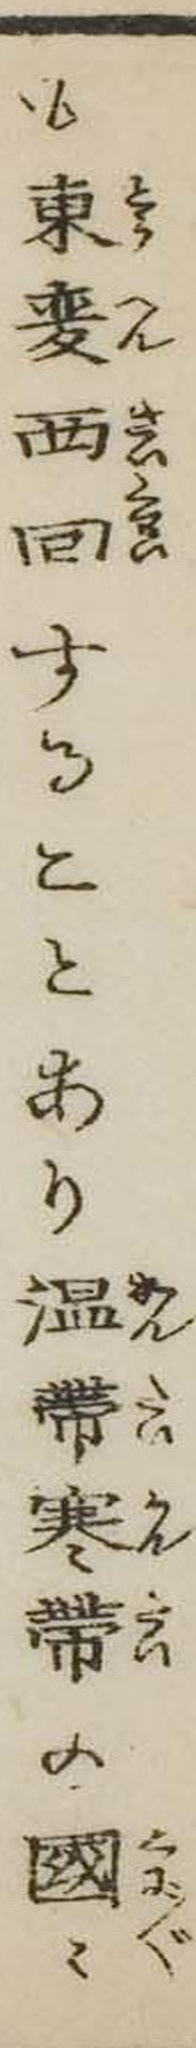も東変西囘することあり温帶寒帶の國〻
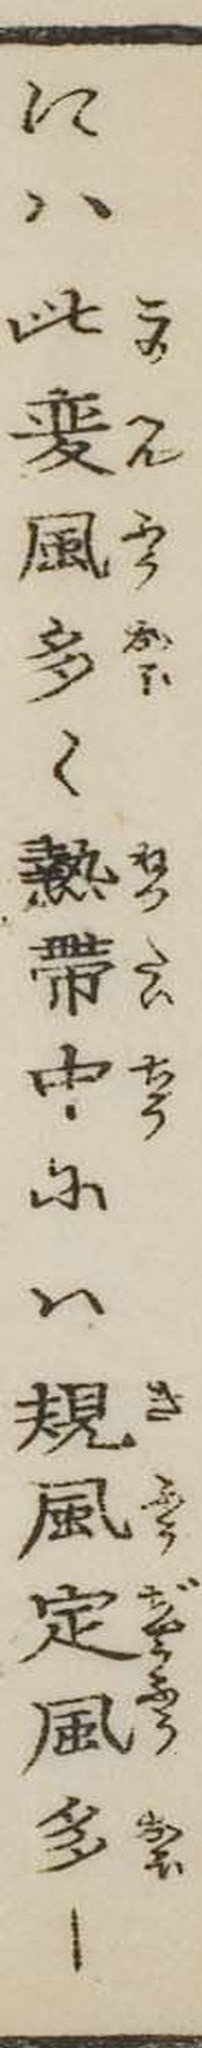には此変風多く熱帶中には規風定風多し
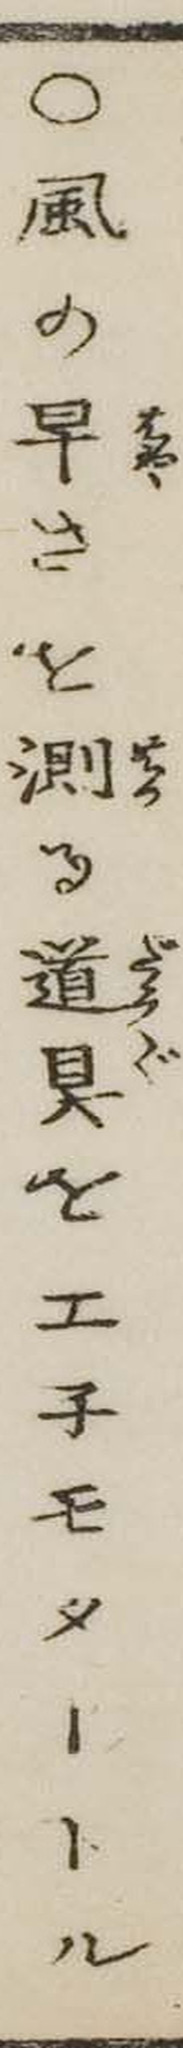◯風の早さを測る道具をエネモメートル
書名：究理知慧の勧 : 訓蒙画入 巻之2
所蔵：東京学芸大学附属図書館
